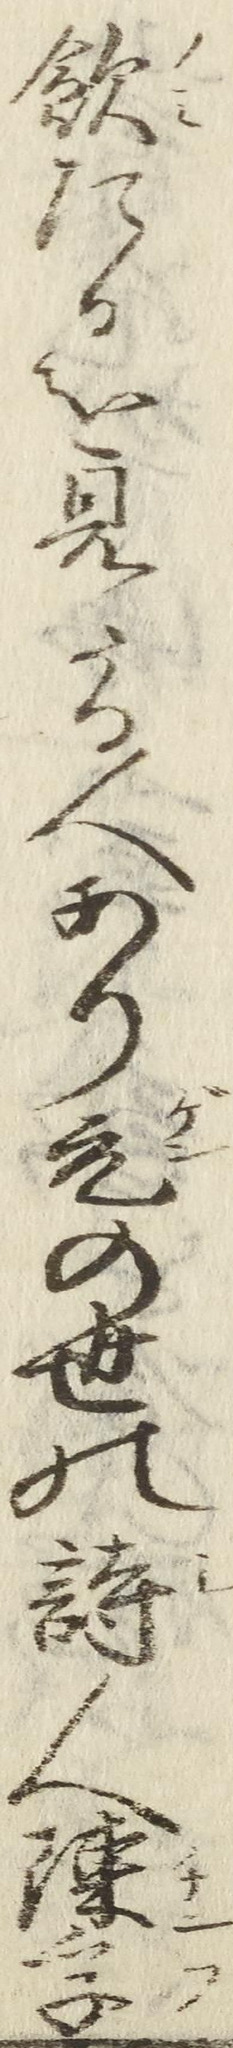飲たるを見たる人あり元の世の詩人陳孚
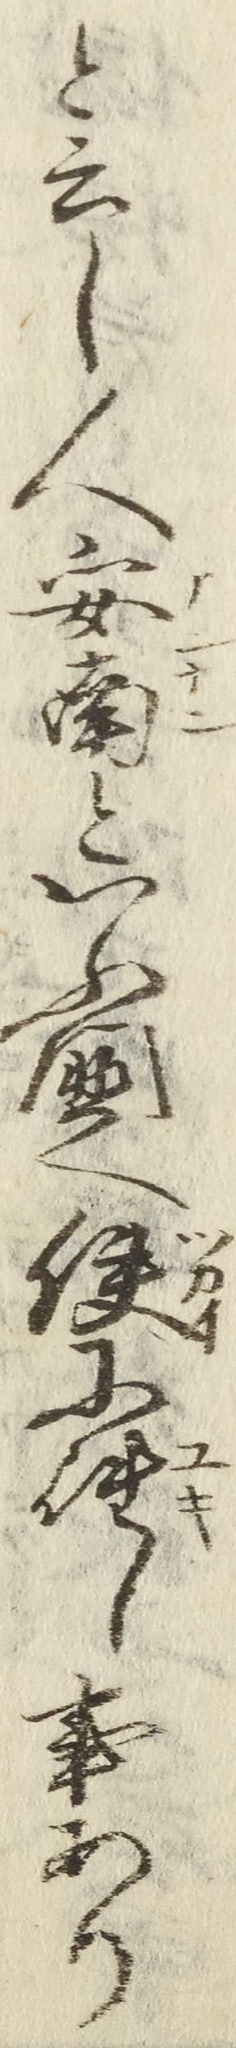と云し人安南といふ国へ使に往し事あり
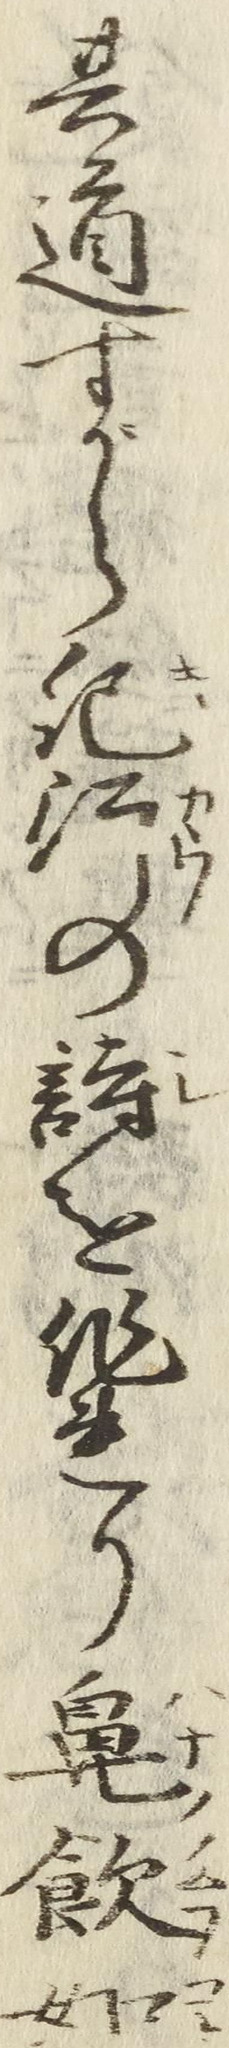其道すがら紀行の詩を作れり鼻飲如

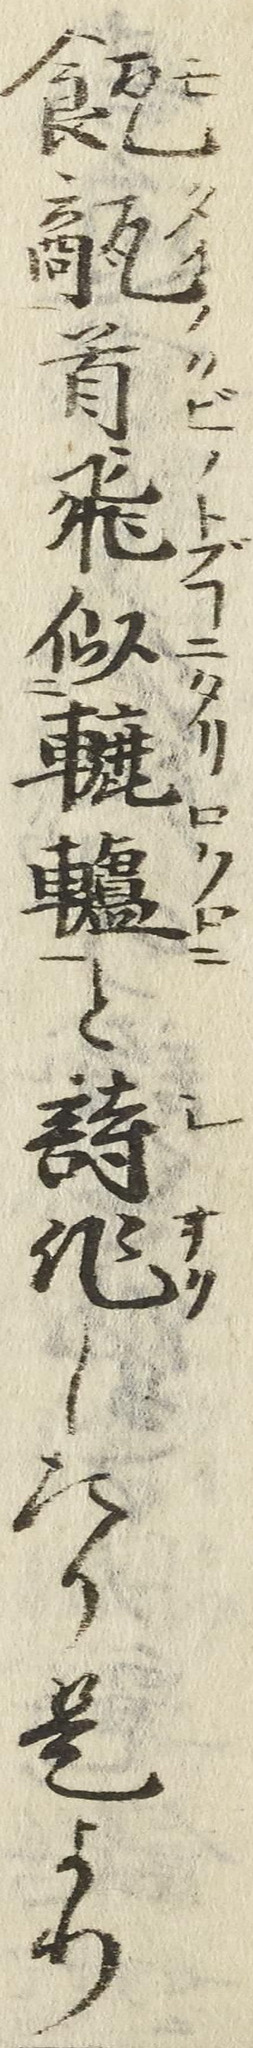モタイ首飛似轆轤と詩作したり是より
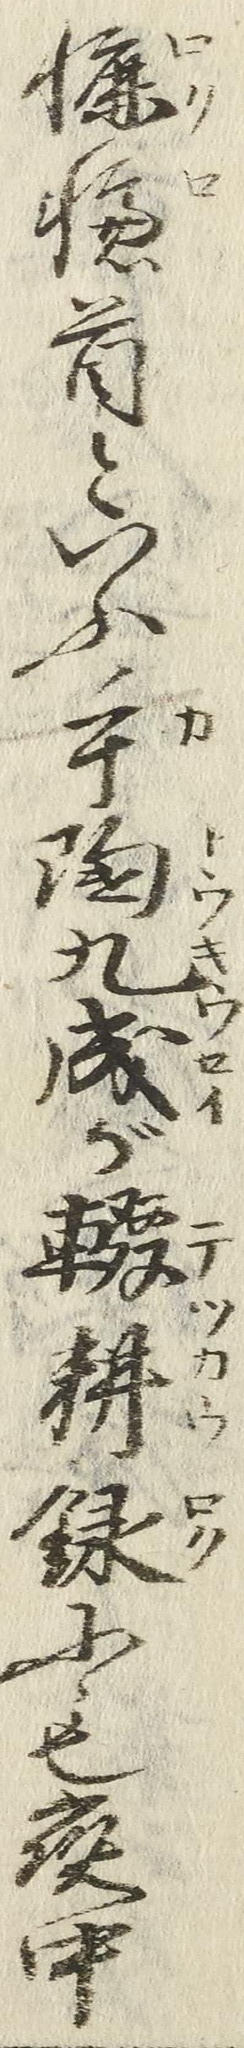轆轤首といふ乎陶九成が輟耕録にも夜中
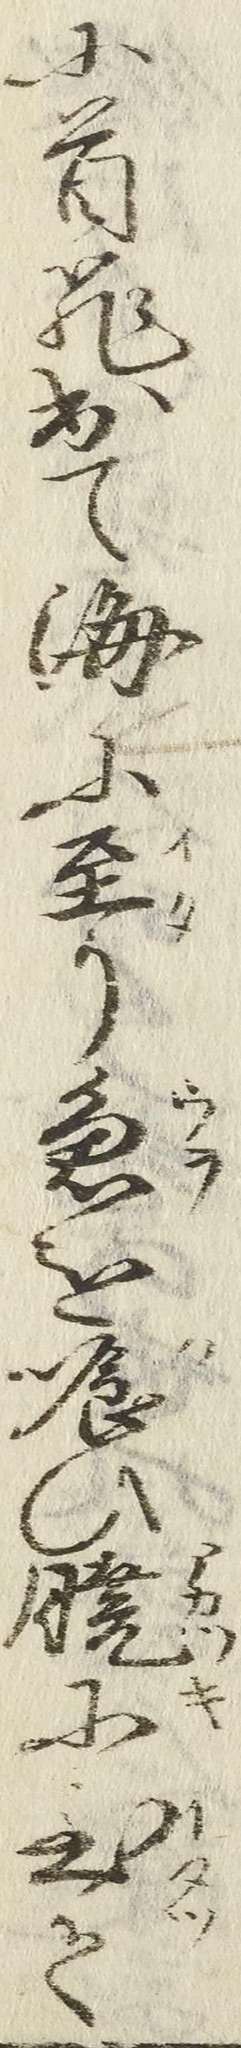に首飛出て海に至り魚を喰ひ暁に至て
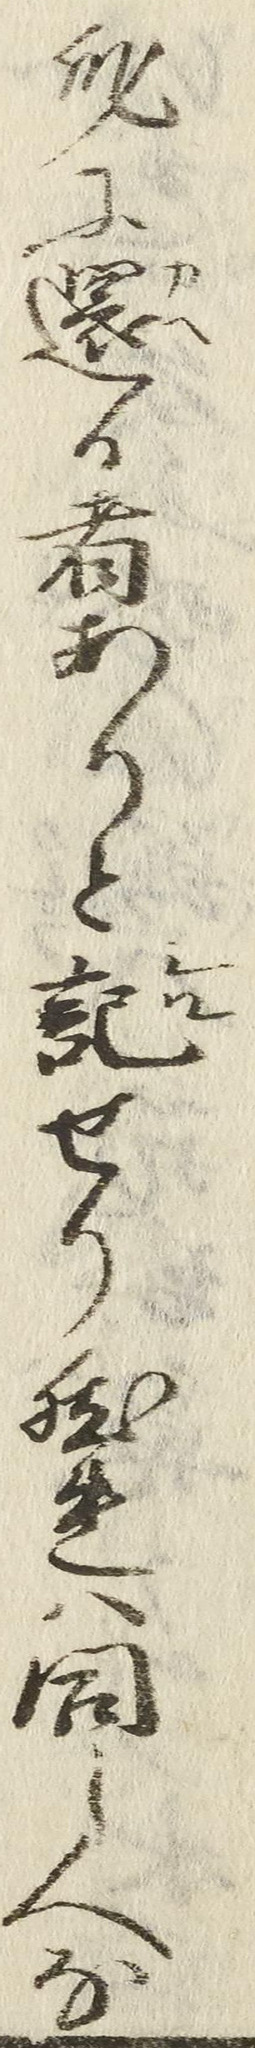身に還る者ありと記せり然れは同し人な
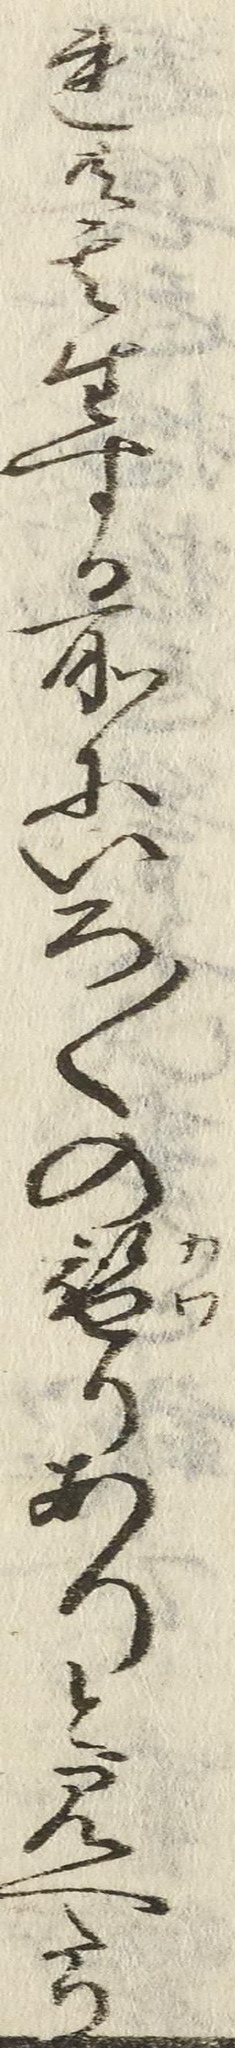れ共其生する所にいろ〳〵の替りありと見へたり
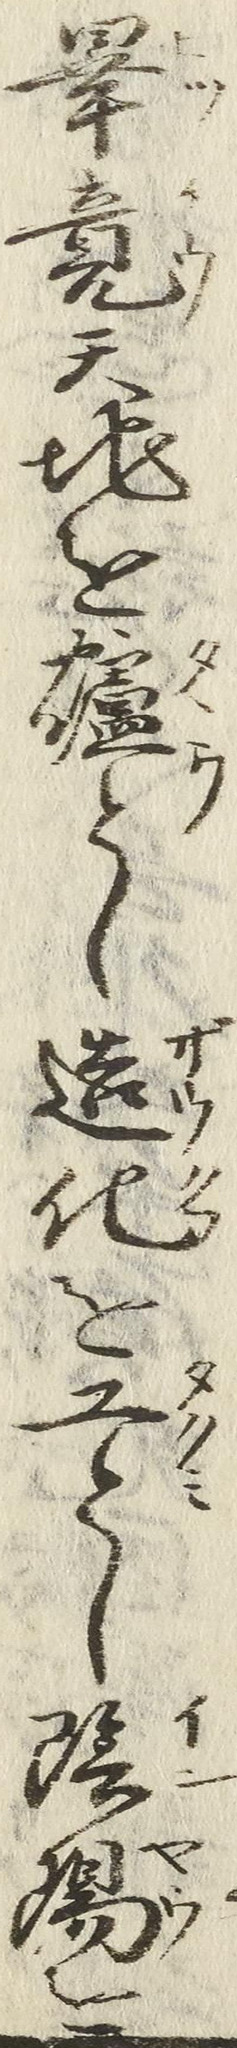畢竟天地を爐とし造化を工とし陰陽を
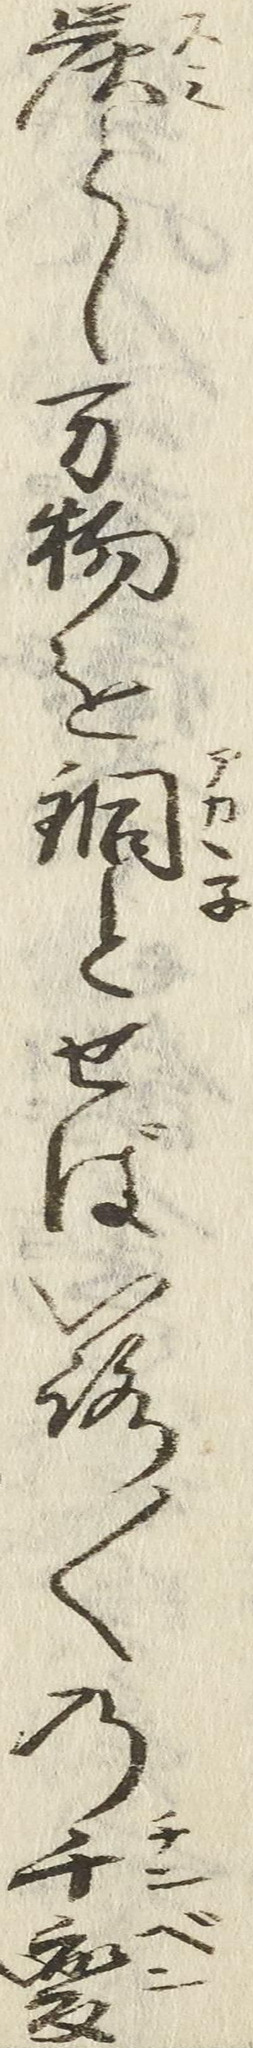炭とし万物を銅とせばいろ〳〵の千変
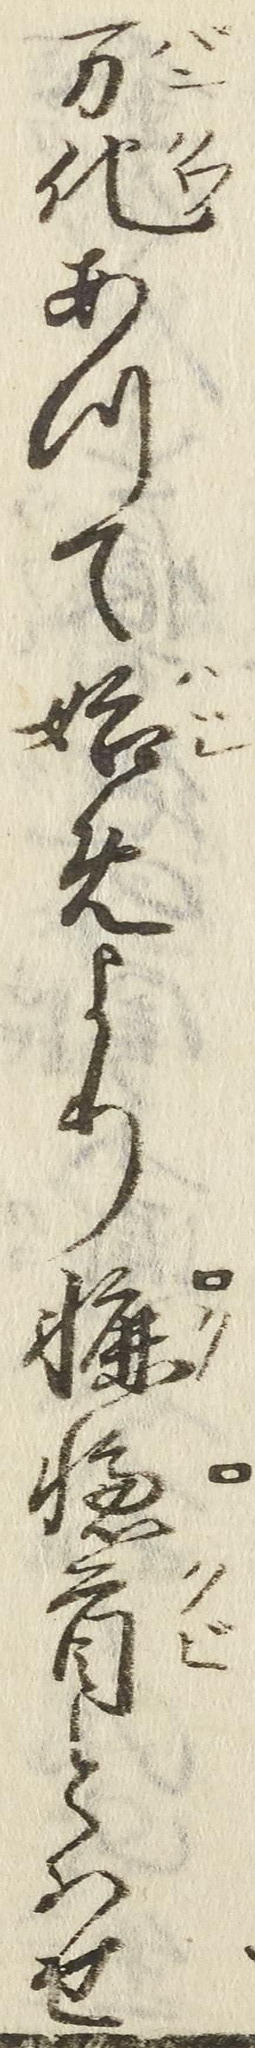万化あつて始めより轆轤首といはせ
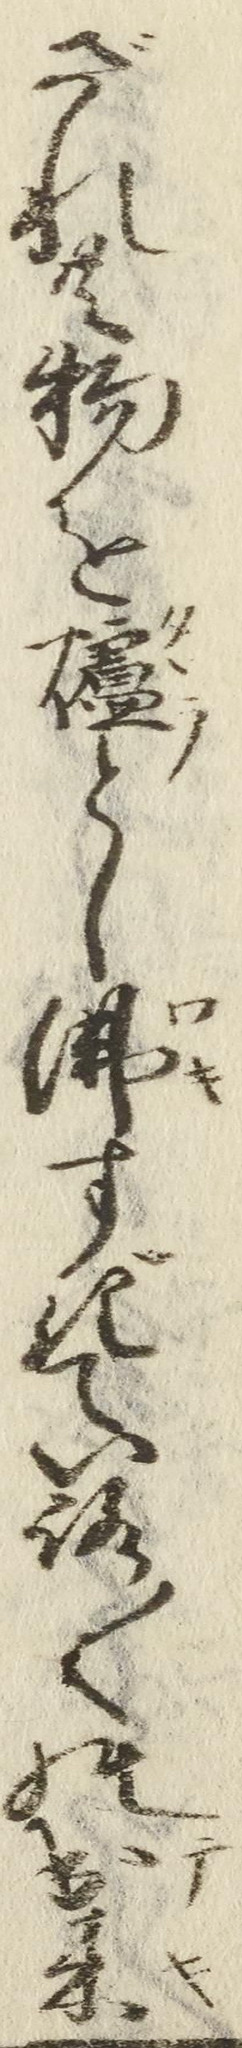ざれ共物を爐とし沸すぎていろ〳〵の出来
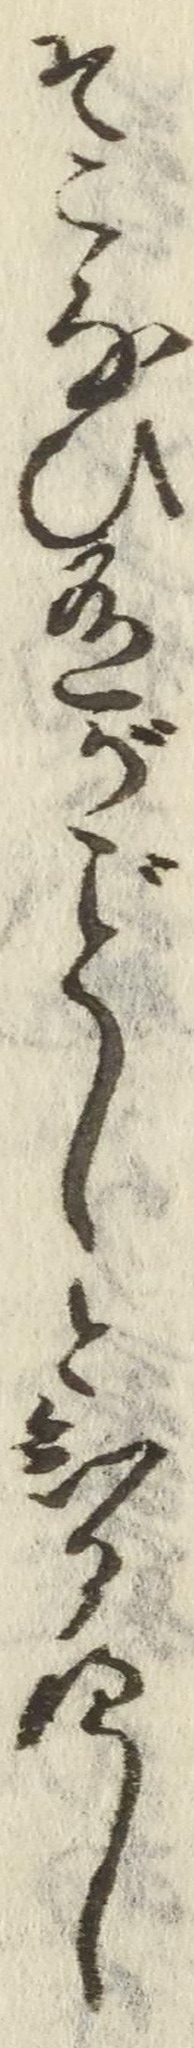そこなひ有がごとしと知るへし
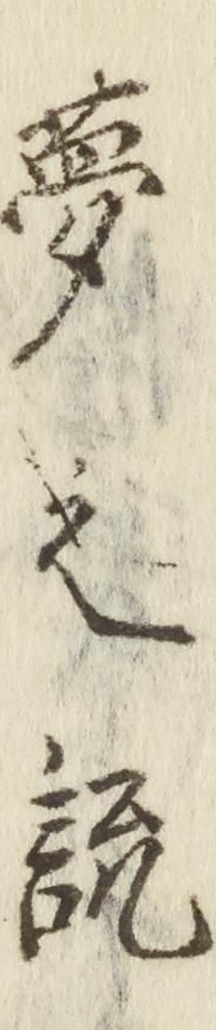夢之説
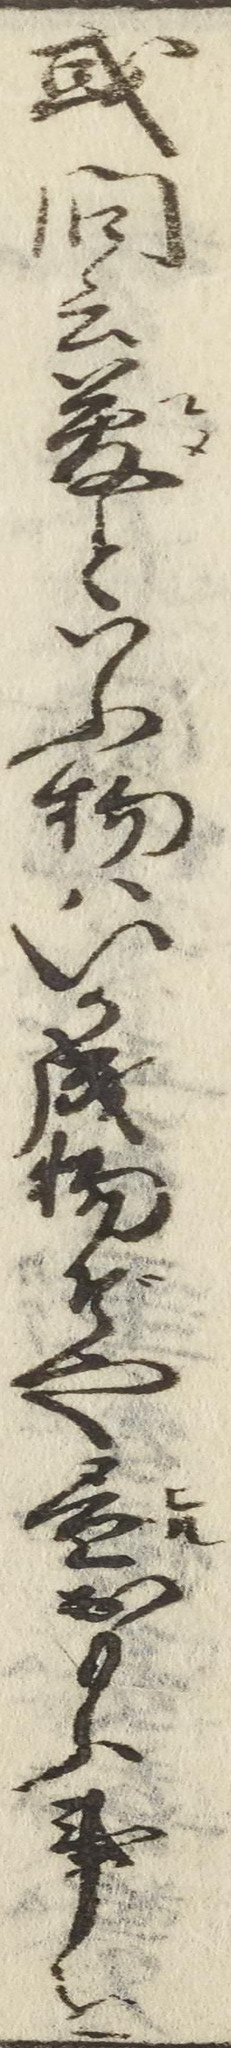或問云夢といふ物はいか成物ぞや昼おもふ事を
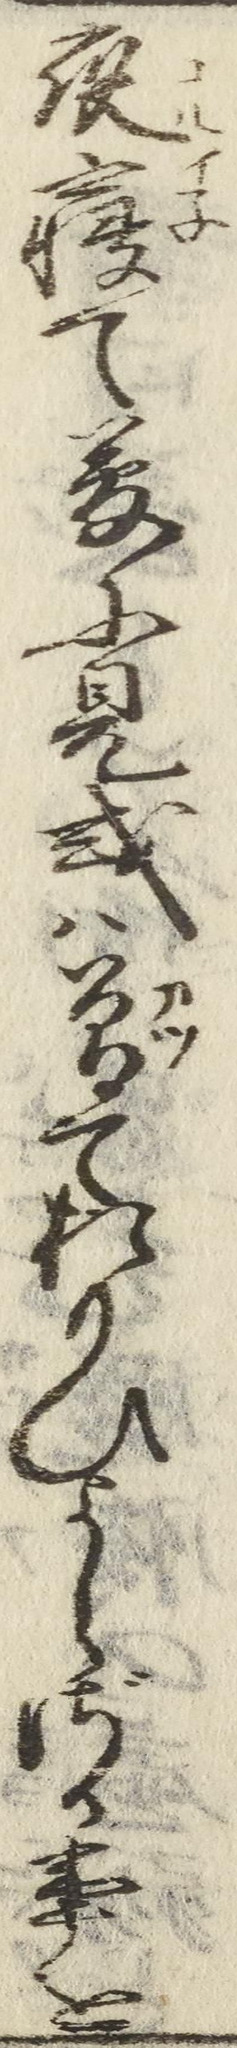夜寝て夢に見或は曽ておもひよらざる事を
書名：天地或問珍　地
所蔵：東京大学地震研究所図書室 Earthquake Research Institute Library, The University of Tokyo, JAPAN
